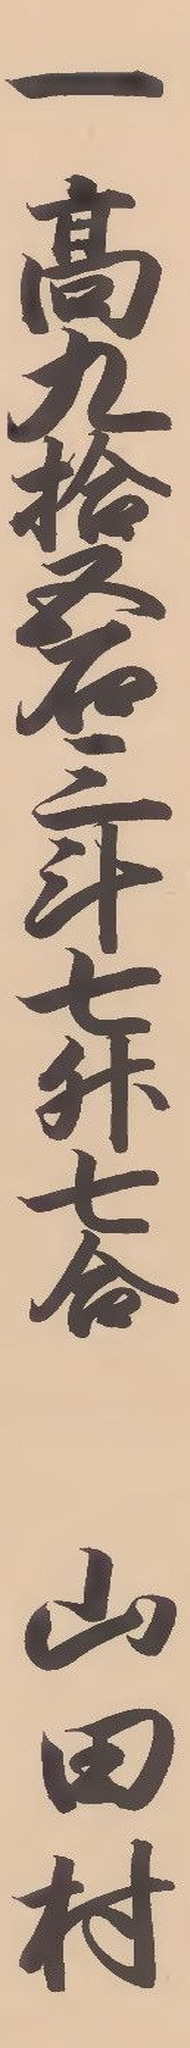一高九拾五石三斗七升七合山田村
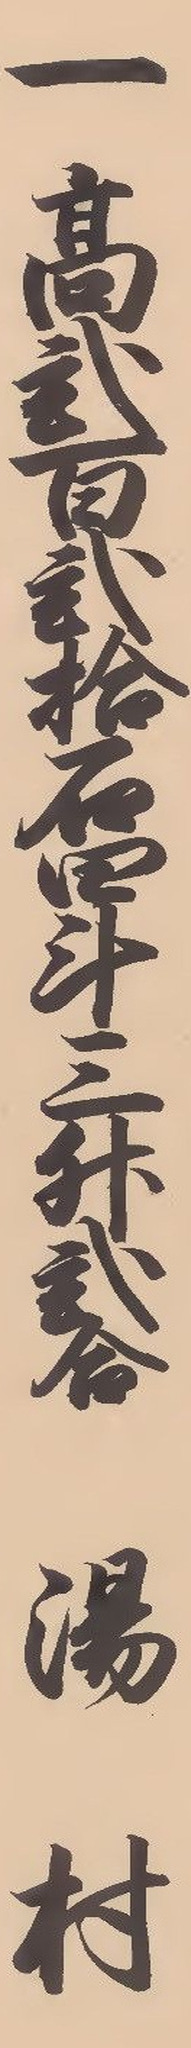一高弐百弐拾石四斗三升弐合湯村

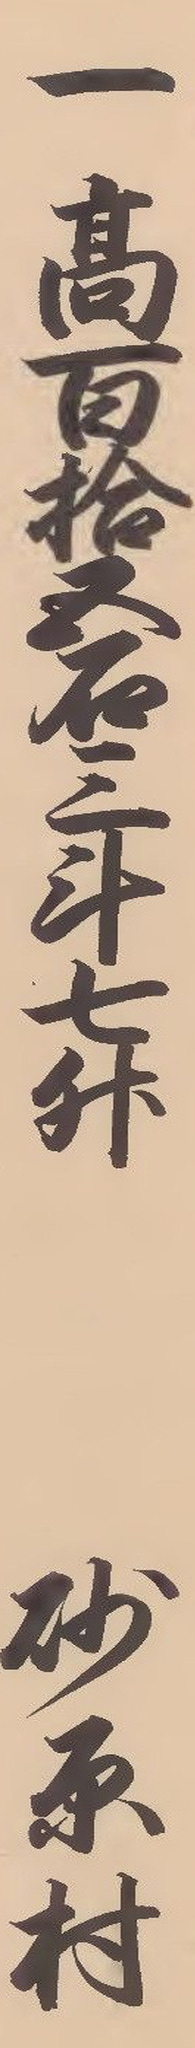一高百拾五石三斗七升砂原村
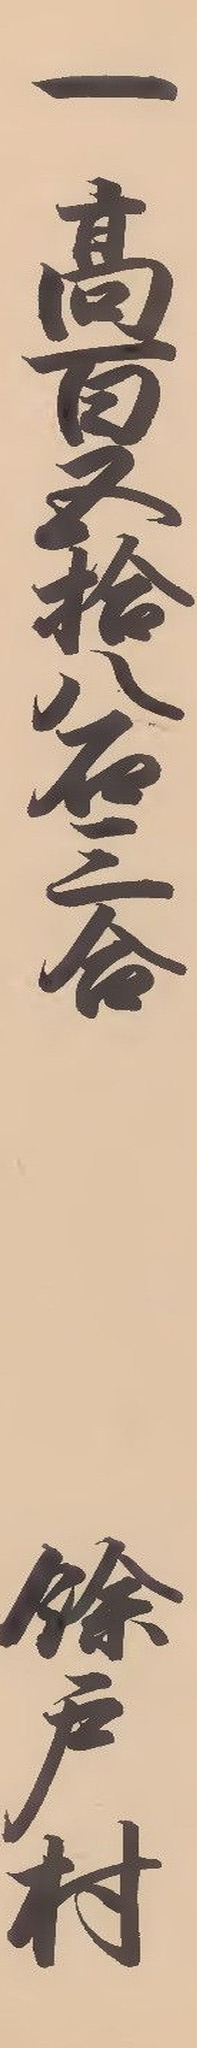一高百五拾八石三合余戸村
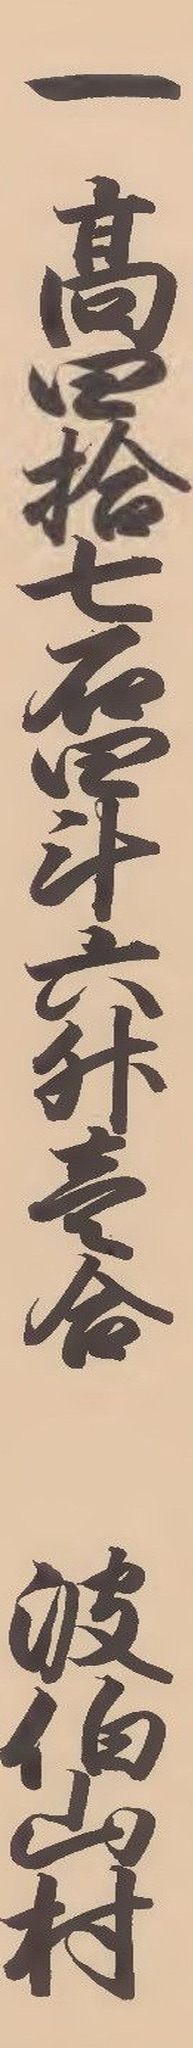一高四拾七石四斗六升壱合波伯山村
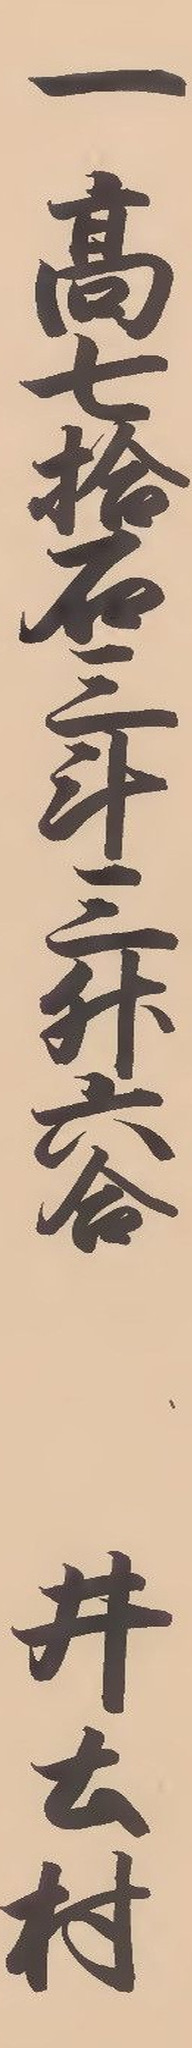一高七拾石三斗三升六合井土村
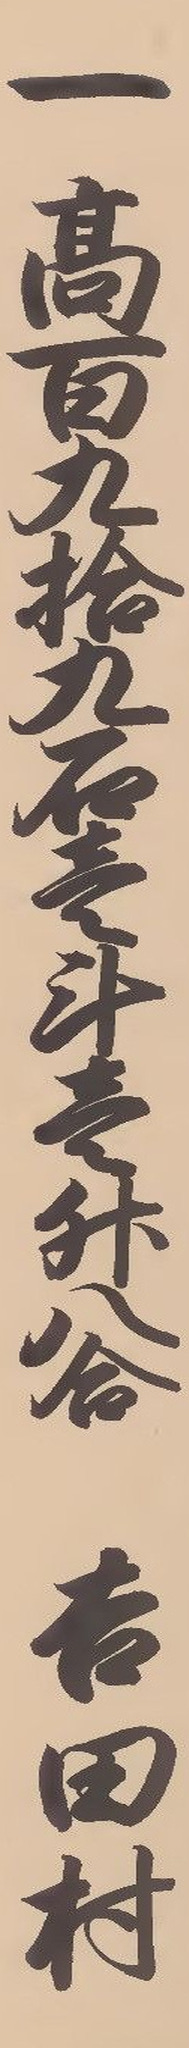一高百九拾九石壱斗壱升八合吉田村
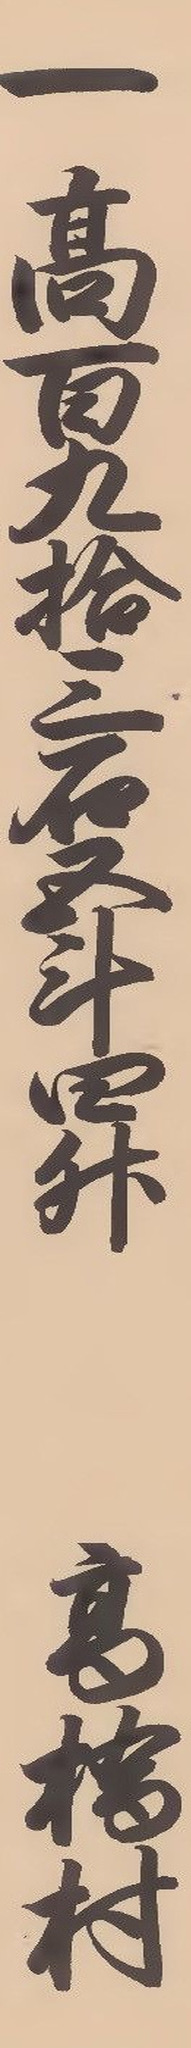一高百九拾三石五斗四升高橋村
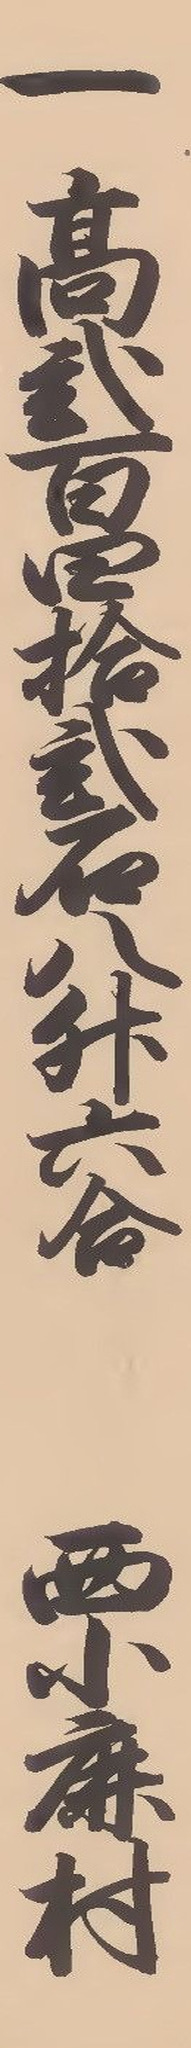一高弐百四拾弐石八升六合西小鹿村
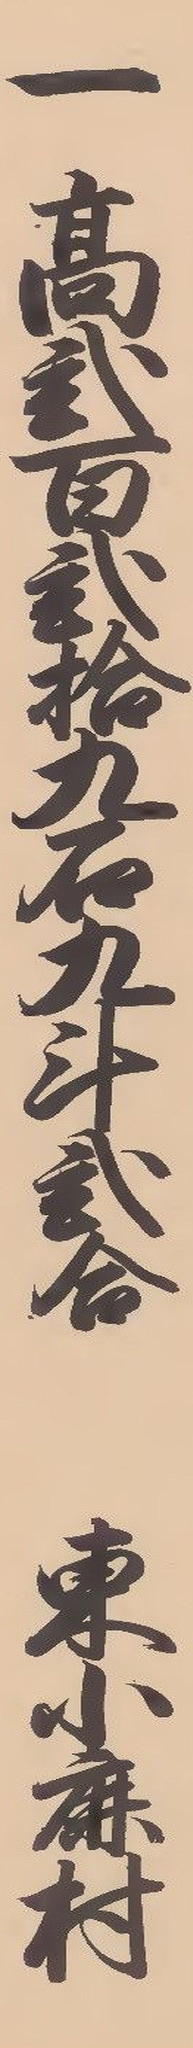一高弐百弐拾九石九斗弐合東小鹿村

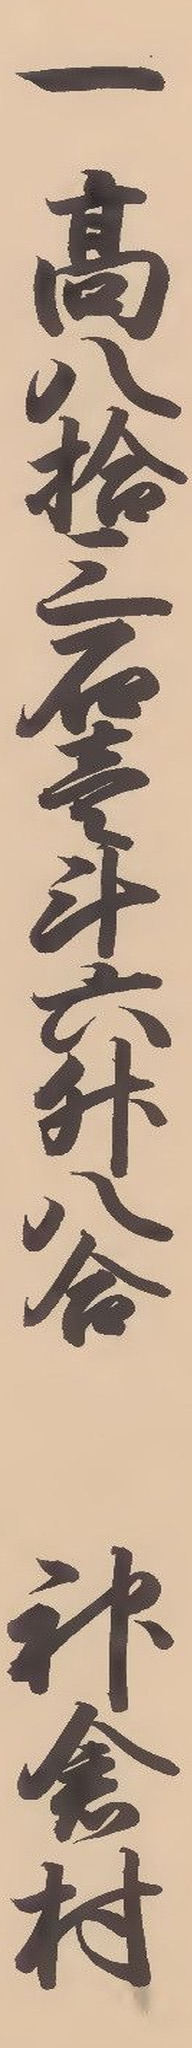一高八拾三石壱斗六升八合神倉村
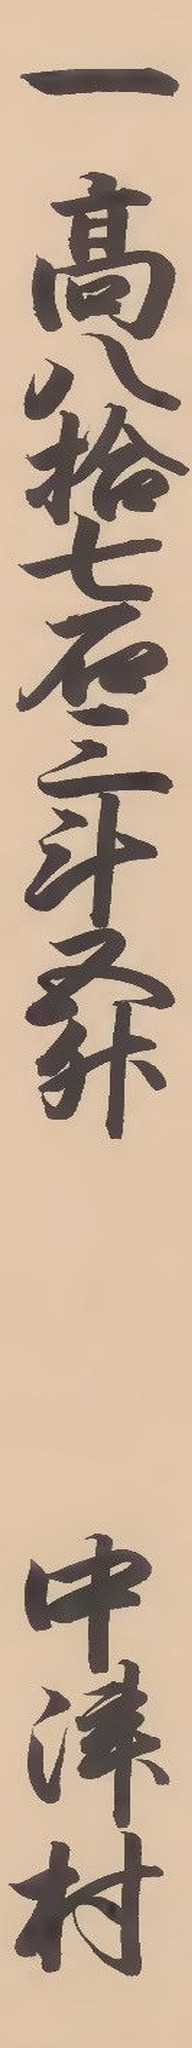一高八拾七石三斗五升中津村
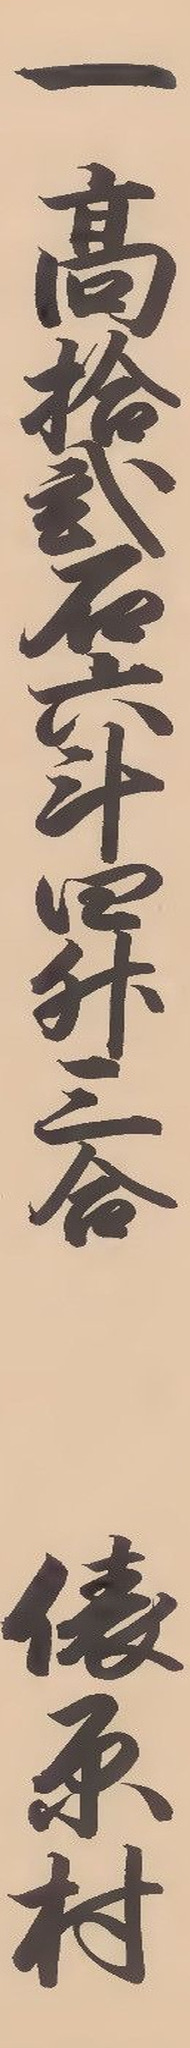一高拾弐石六斗四升三合俵原村
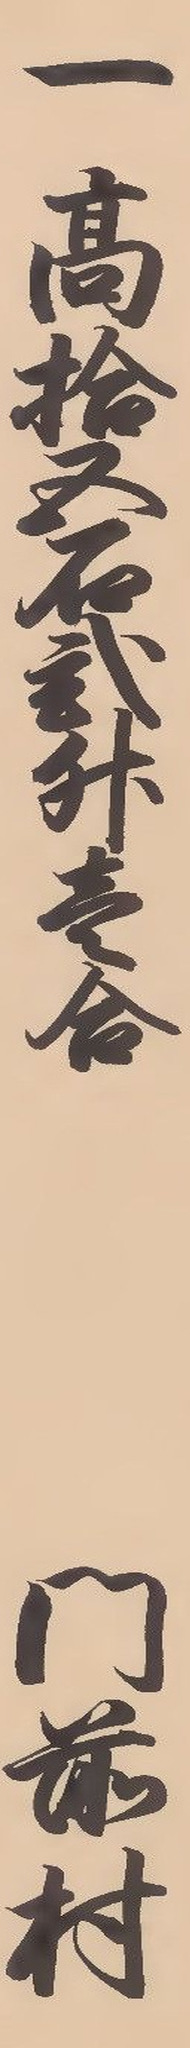一高拾五石弐升壱合門前村
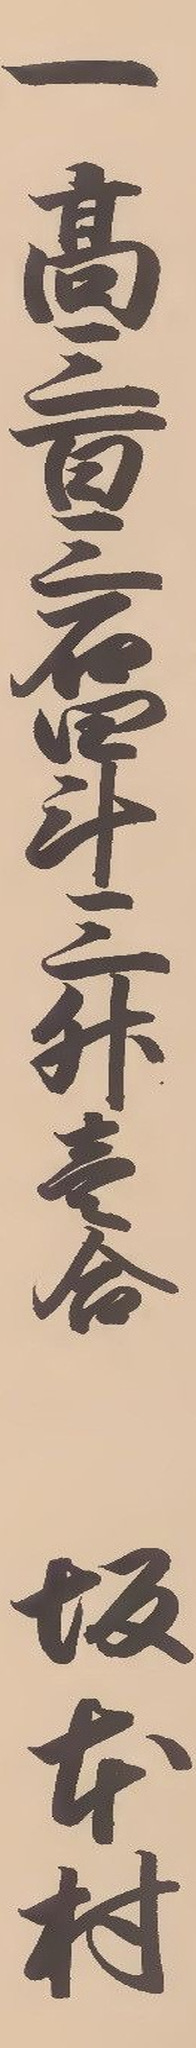一高三百三石四斗三升壱合坂本村
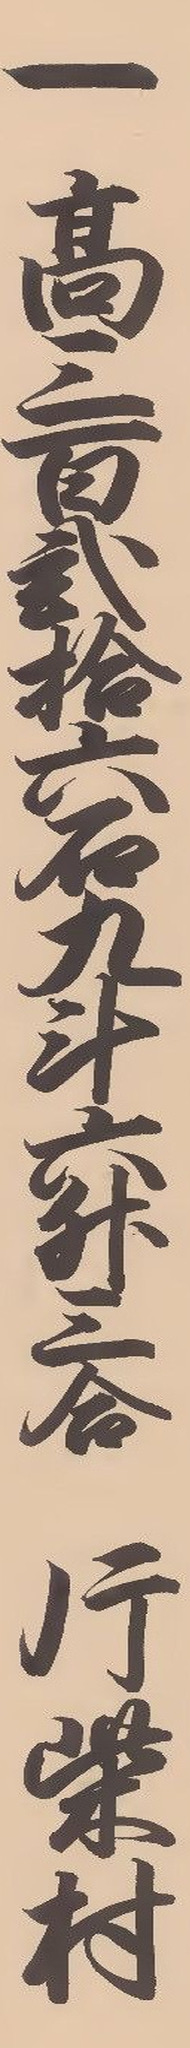一高三百弐拾六石九斗六升三合片柴村
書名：伯耆国郷帳
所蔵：国立公文書館 National Archives of Japan
